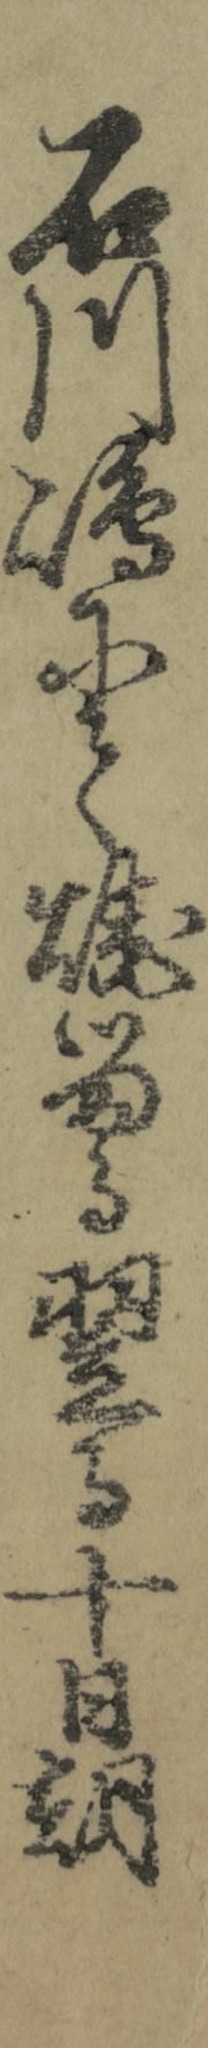して佃嶋にて焼留る翌る十日朝
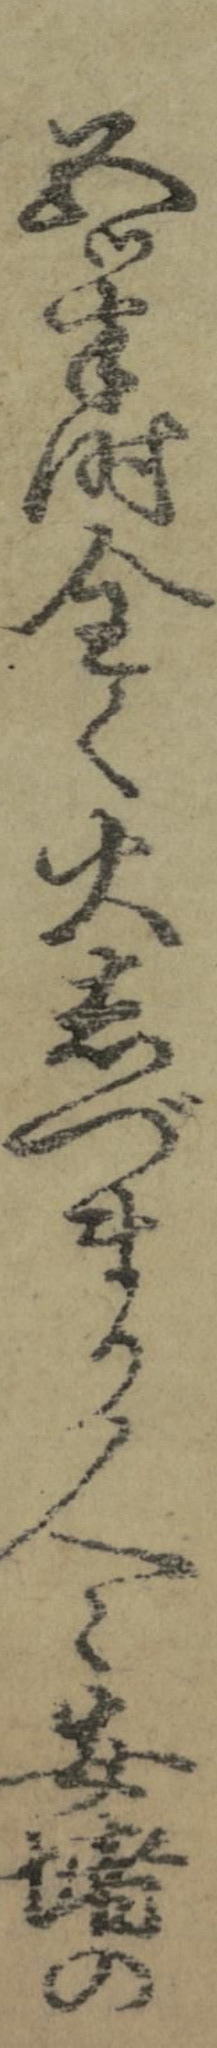五ッ半時全く火しずまり人々安堵の
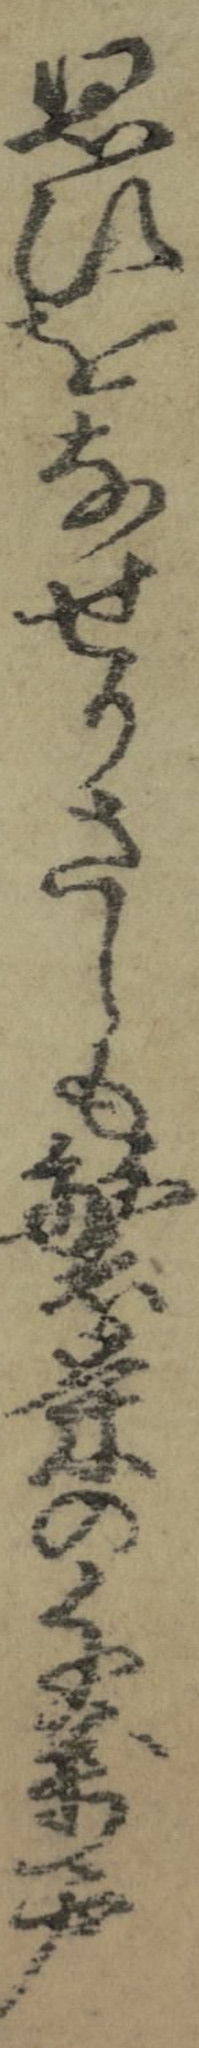思ひをなせりさても繁栄の千万戸
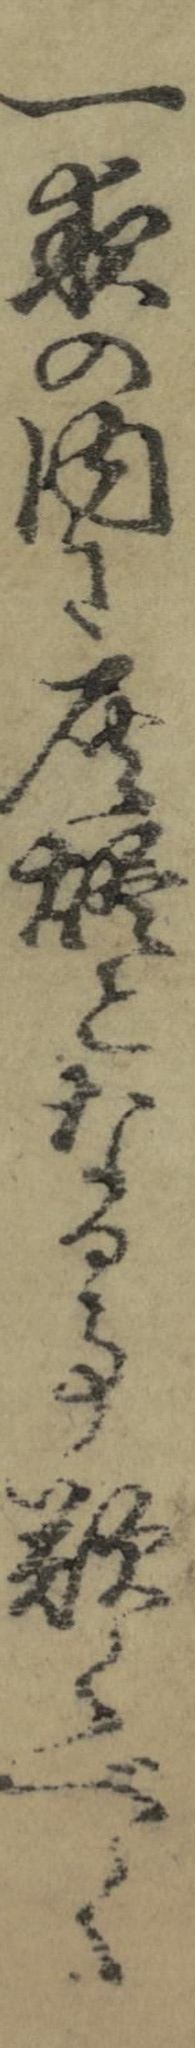一夜の内二灰焼となる事歎くべく
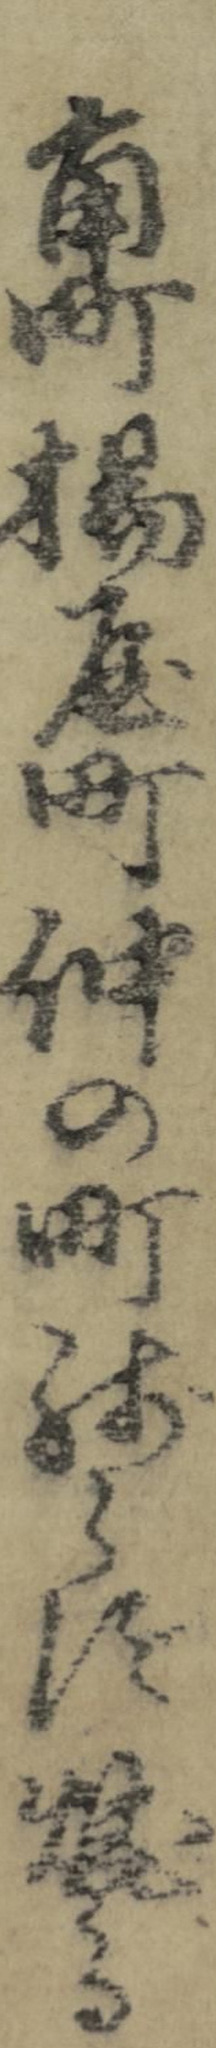南町揚屋町仲の町残らず焼る
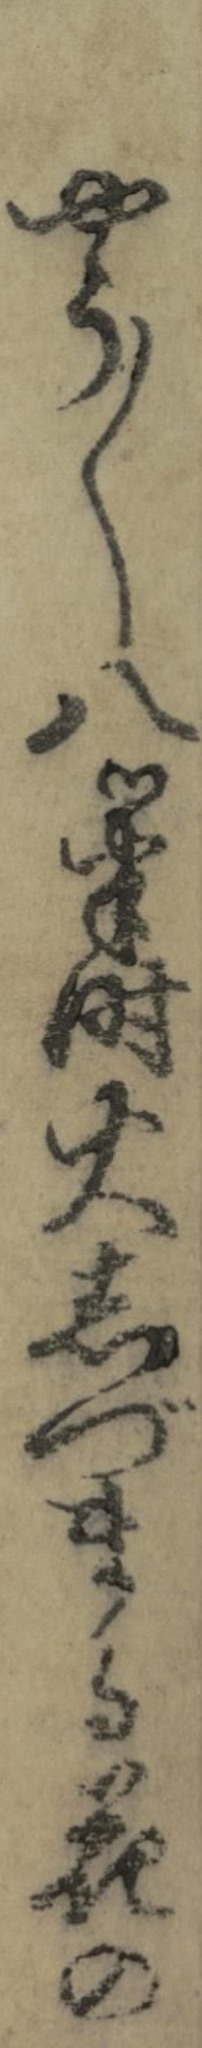やう〳〵八ッ半時火しずまる花の
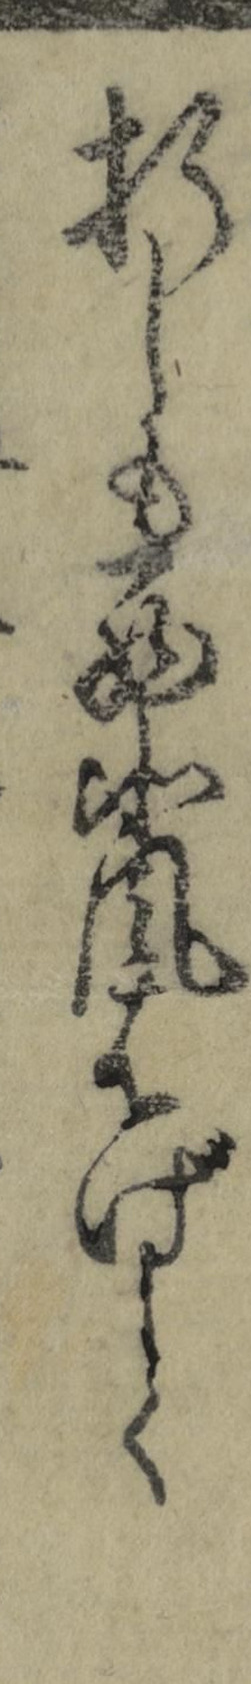折しも西北風はげしく
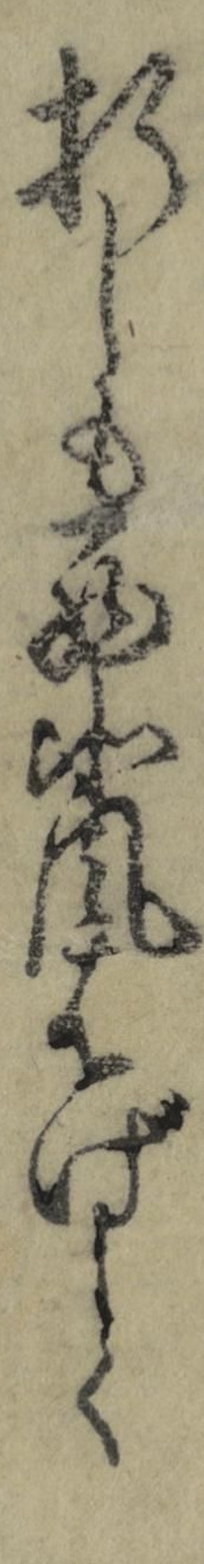折しも西北風はげしく
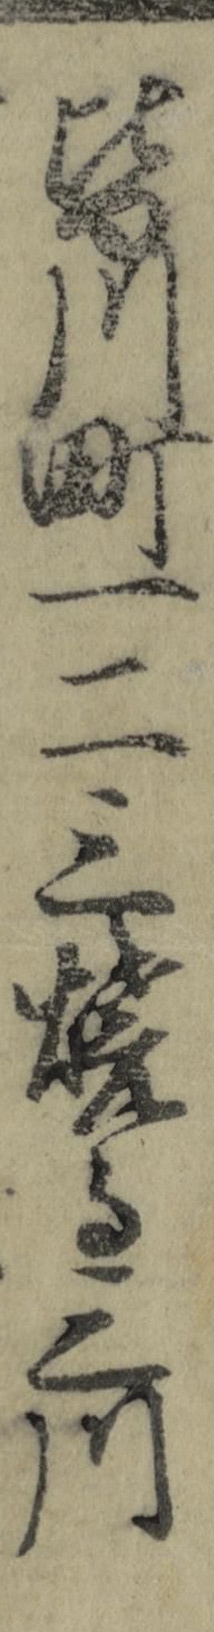皆川町一二三焼る三川
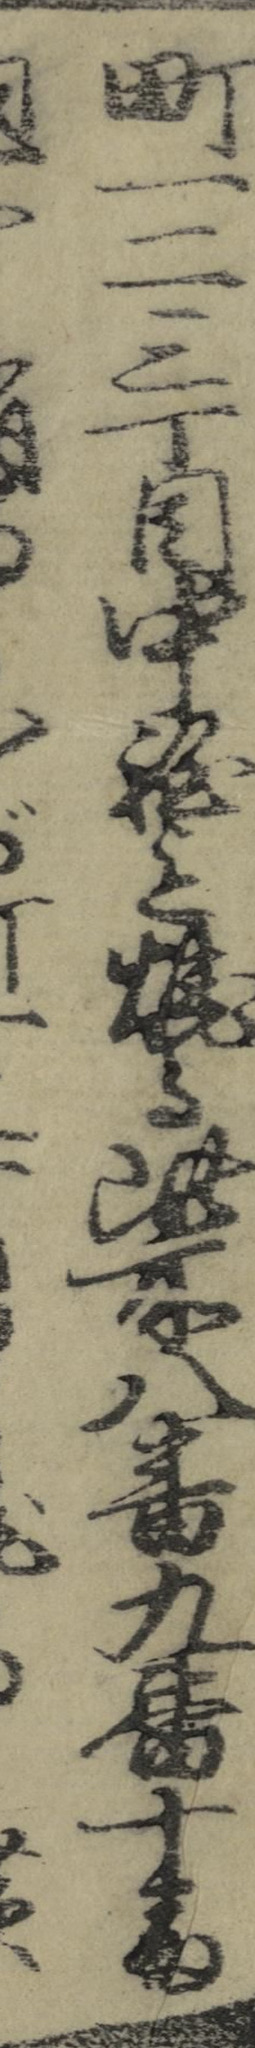町一二三丁目中程迄焼る此所八番九番十番
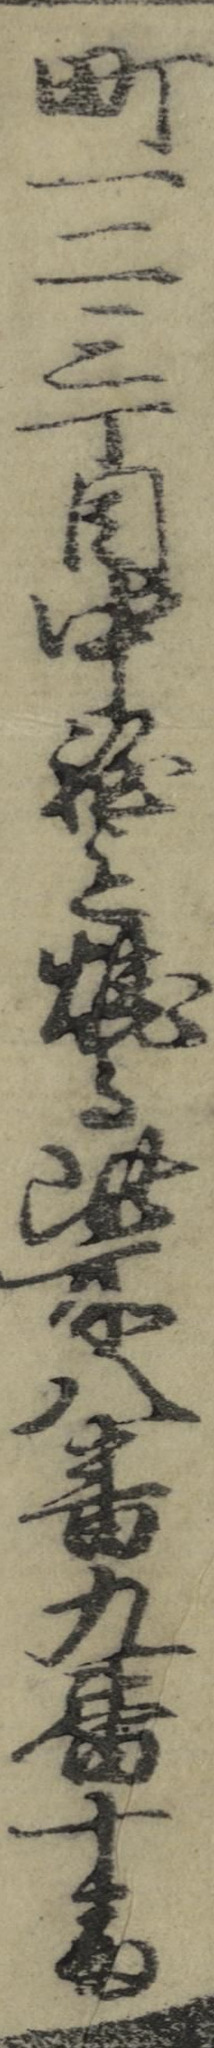町一二三丁目中程迄焼る此所八番九番十番
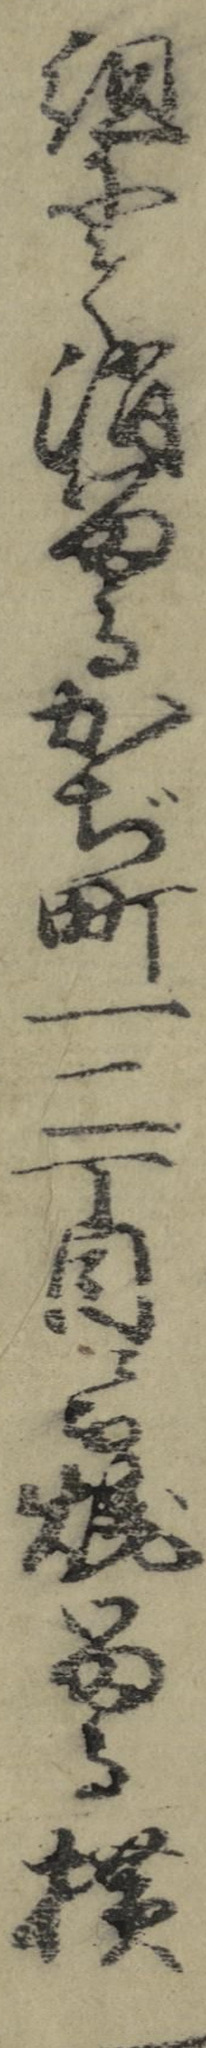組にて消留るかぢ町一二丁目二而焼留る横
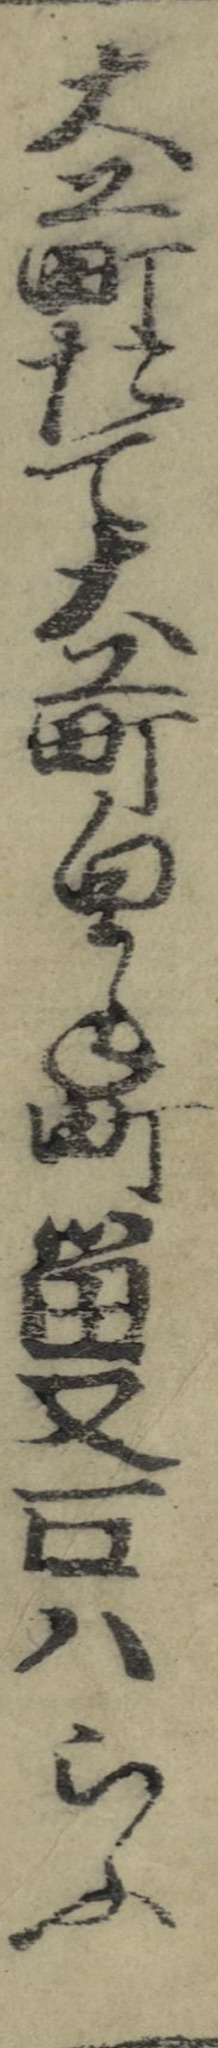大工町たて大工町白かね町留又一口ハらふ
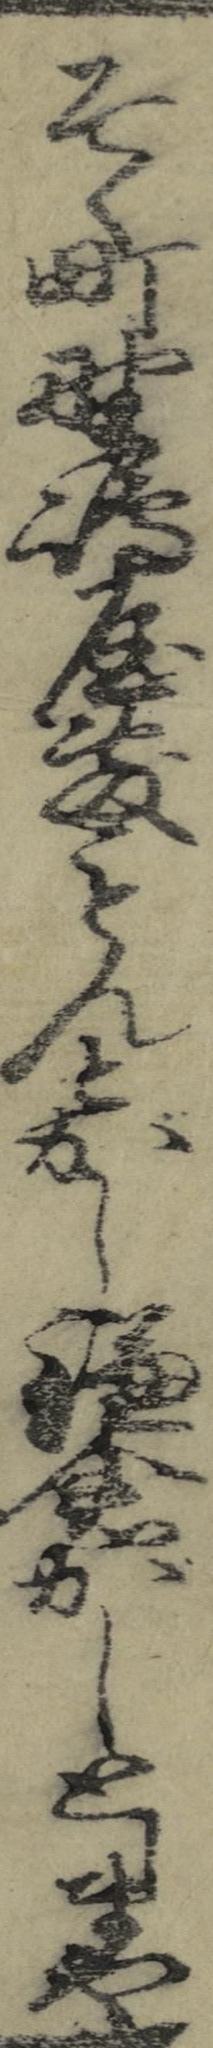そく町野嶋屋敷はんとかし鎌倉かしとしまや
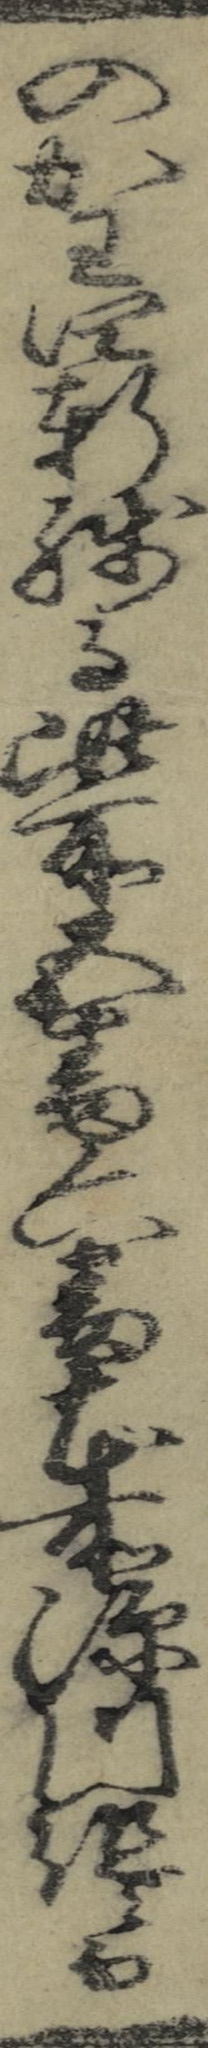のかわ四軒残る此所五番六番本所源川組二而
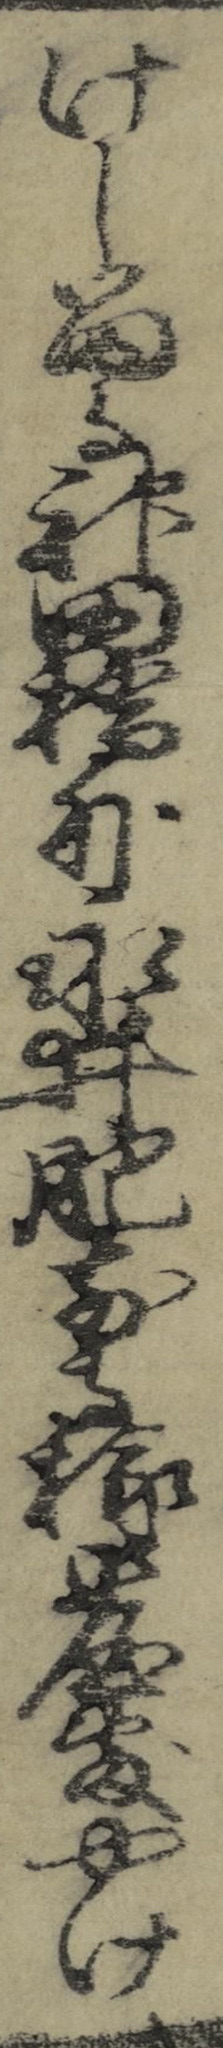けし留る神田橋外永井肥前守様御屋敷やけ
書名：焼場方角附
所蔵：東京大学地震研究所図書室 Earthquake Research Institute Library, The University of Tokyo, JAPAN
